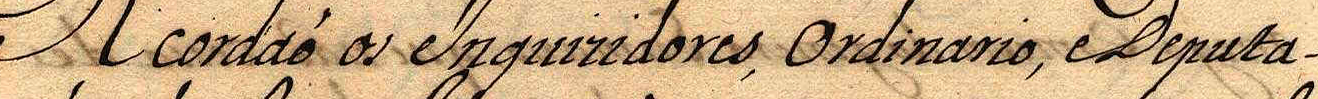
Acordaõ os Inquizidores, Ordinario, e Deputa
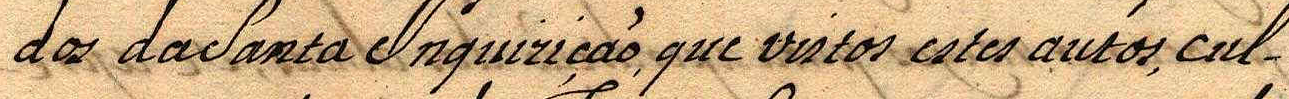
dos da Inquisiçaõ que vistos estes autos, cul
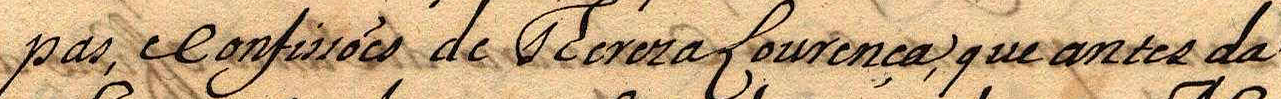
pas, e confissões de Thereza Lourença, que antes da
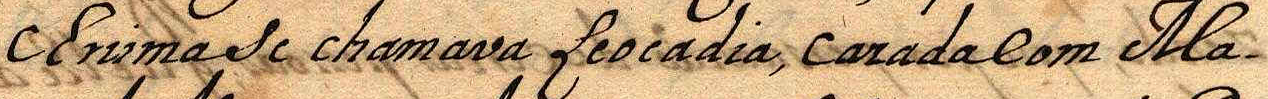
Chrisma se chamava Leocadia, cazada com Ma
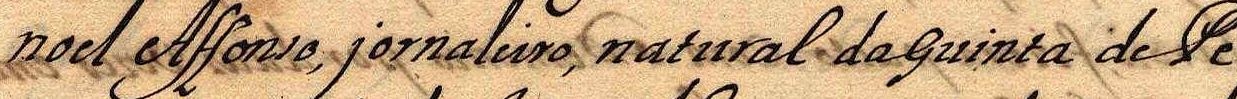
noel Affonso, jornaleiro, natural da Quinta de Pe
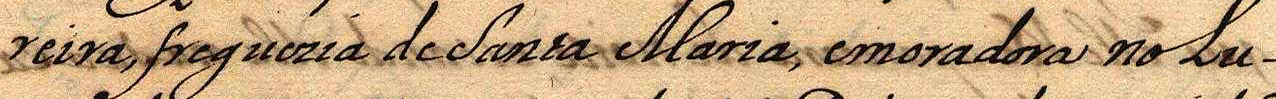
reira, freguezia de Santa Maria, e moradora no Lu
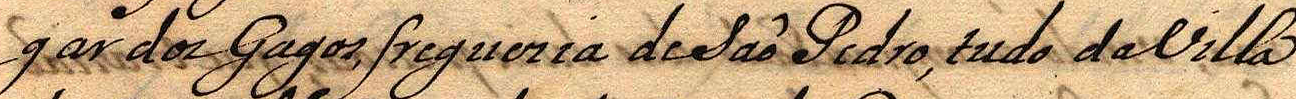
gar dos Gagos, freguezia de Saõ Pedro, tudo da Villa
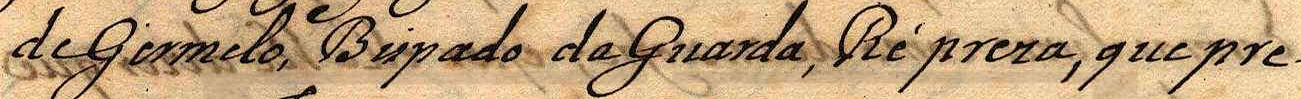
de Germelo, Bispado da Guarda, Ré preza, que pre
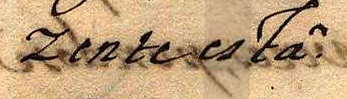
zente está.
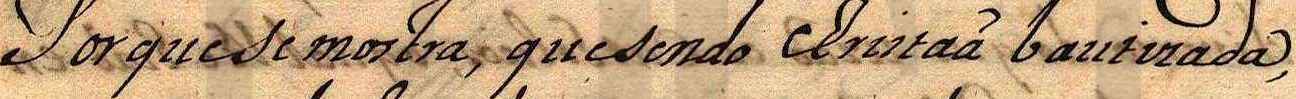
Por que se mostra, que sendo christaã bautizada,
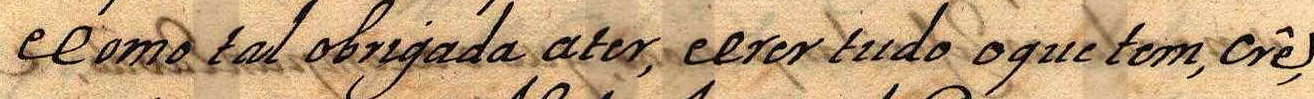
e como tal obrigada a ter, e crer tudo o que tem, crê,
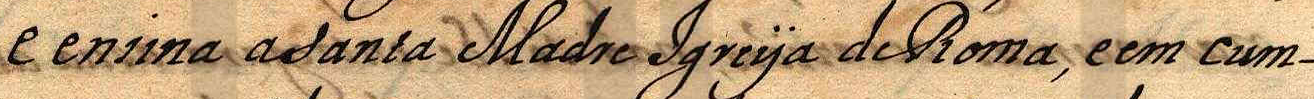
e ensina a Santa Madre Igreija de Roma, e em cum
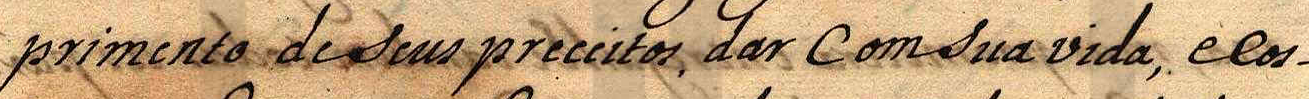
primento de seus preceitos, dar com sua vida, e cos
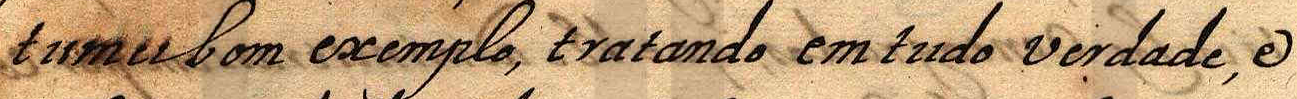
tumes bom exemplo, tratando em tudo verdade, e
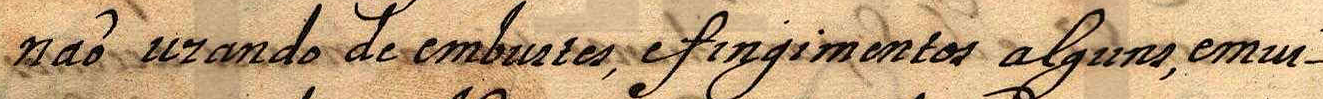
naõ uzando de embustes, e fingimentos alguns, e mui
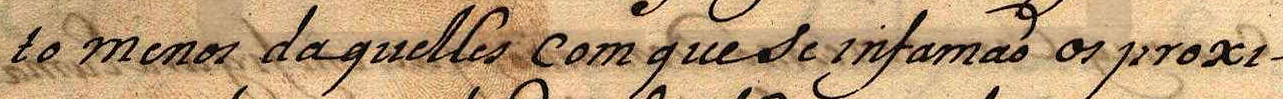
to menos daquelles com que se infamaõ os proxi
